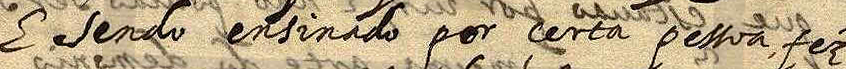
e sendo ensinado por çerta pessoa, fez̄
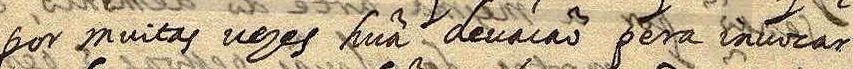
por muitas vezes huã deuoçaõ pera inuocar
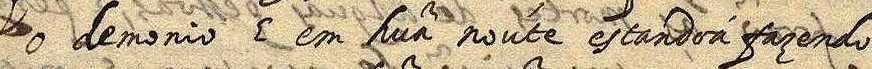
o demonio e em huã noute estandoa fazendo
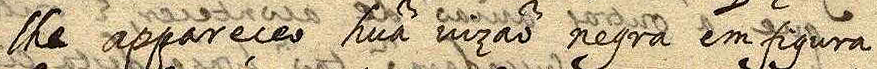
lhe appareçeo huã uizaõ negra em figura
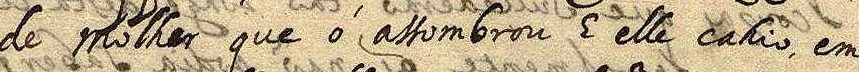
de molher que o assombrou e elle cahio em
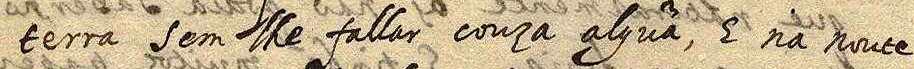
terra sem lhe fallar couza alguã, e na noute
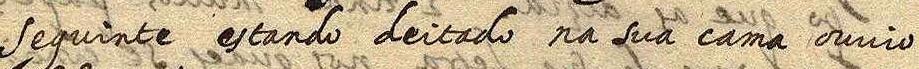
seguinte estando deitado na sua cama ouuio
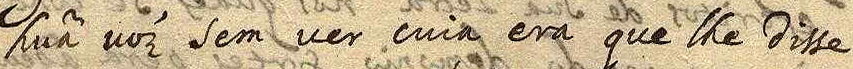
huã uoz sem uer cuia era que lhe disse
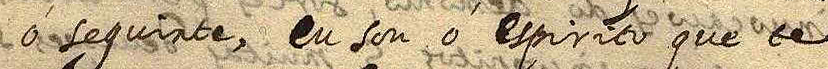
o seguinte, eu sou o espirito que te
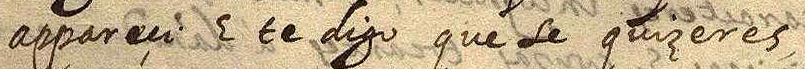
appareçi e te digo que se quizeres,
